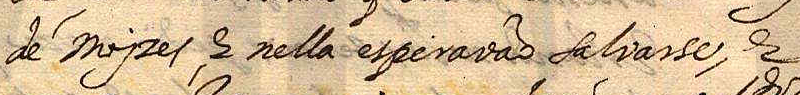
de mojzes, E nella esperavaõ salvarse, E
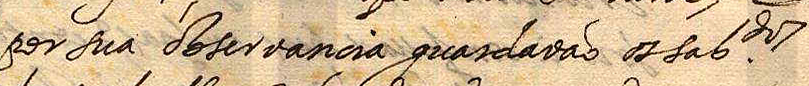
por sua observancia guardavaõ os sab.dos
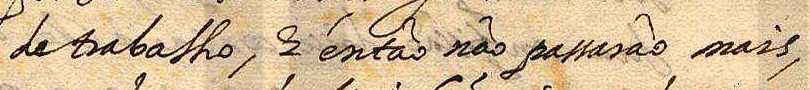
de trabalho, E então não passarão mais,
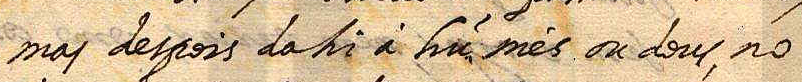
mas despois dahi a hū mes ou dous, no
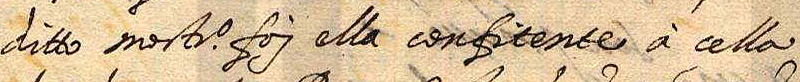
ditto mostr.o foj ella confitente à cella
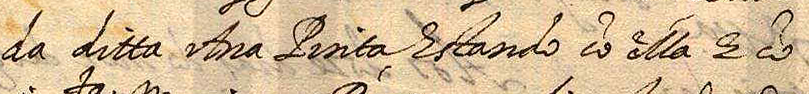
da ditta Ana Pinta, Estando cō ella E cō
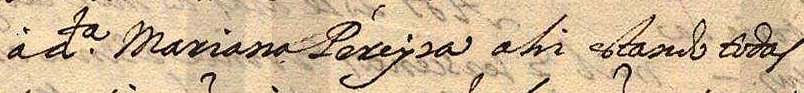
a d̄a. Mariana Pereyra ahi estando todas
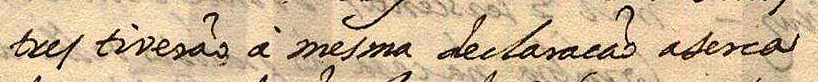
tres tiveraõ a mesma declaração aserca
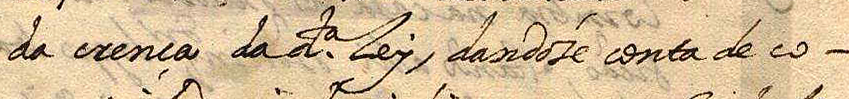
da crença da d̄a. Ley, dandose conta de co
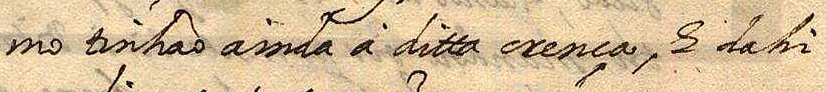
mo tinhão ainda a ditta crença, E dahi
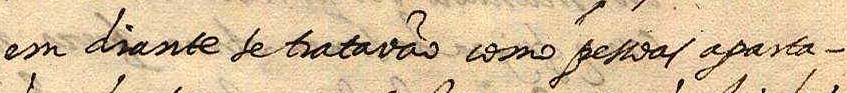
em diante se tratavão como pessoas aparta
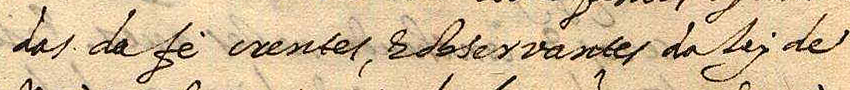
das da fé crentes, E observantes da lej de
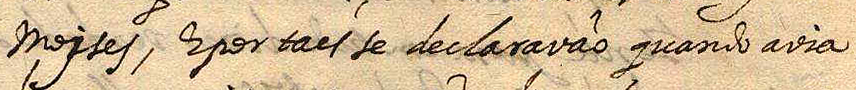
Mojses, E por taes se declaravão quando avia
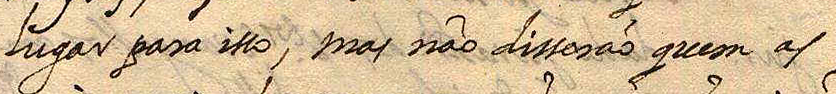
lugar para isso, mas não disseraõ quem as
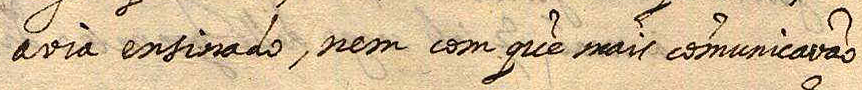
avia ensinado, nem com quē mais com̄unicavão
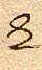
E
